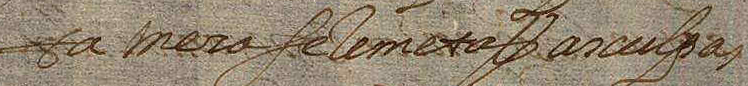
ta meza se Remetaõ as culpas
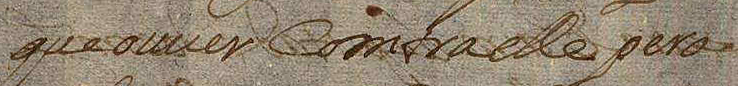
que ouuer Comtra elle pera
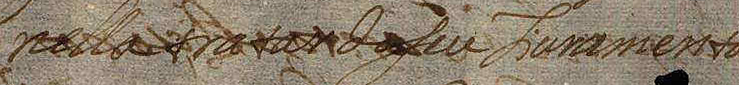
nella tratar do seu Liuramento
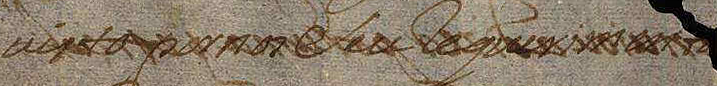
uisto por nos seu Requerimento
